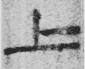上
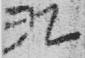九
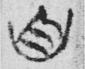自
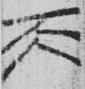天
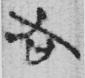右（祐）
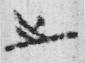之
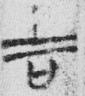吉
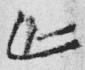亡（无）
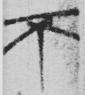不
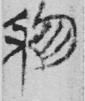利
